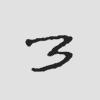乃
